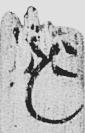○（寡）
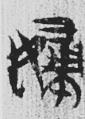婦
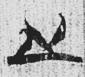之
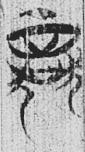獄
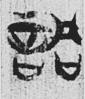訟
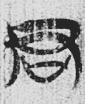君
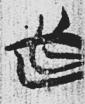必
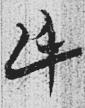身
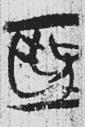聖（聽）
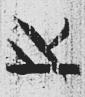之
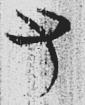又（有）
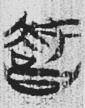智（知）
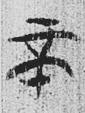不
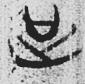足
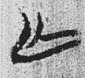亡
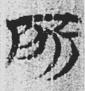所
